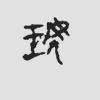琥
